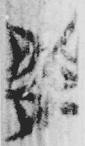○（間）
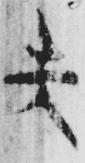○（堯）
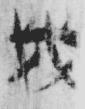戔（賤）
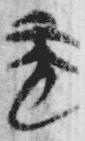而
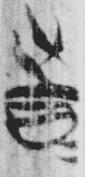時時
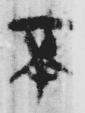不
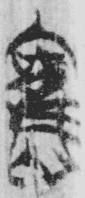○（勸）
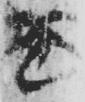而
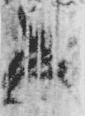民
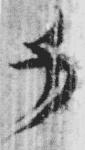力
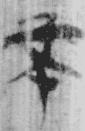不
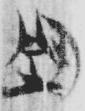型（刑）
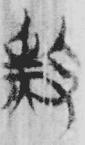殺
